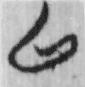㠯
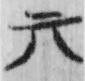亓
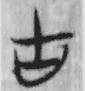古
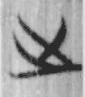之
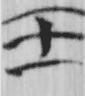王
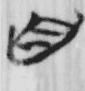自
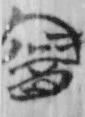酓（熊）
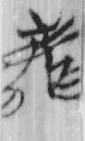鹿
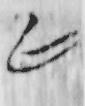㠯（以）
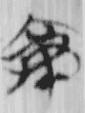○（就）
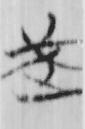武
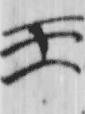王
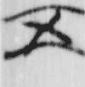五
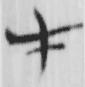牛
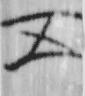五
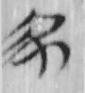豕
